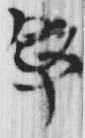事
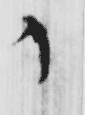人
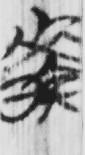○（早）
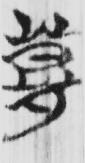○（暮）
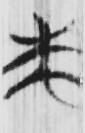求
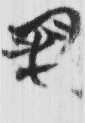朔
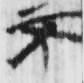不
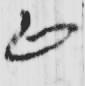㠯（以）
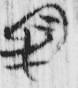朔
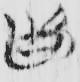○（廷）
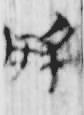阩
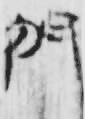門
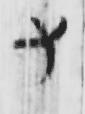又
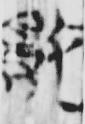敗
